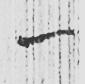一
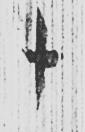十
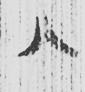八
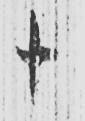十
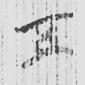五
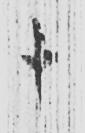十
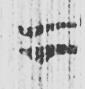二
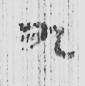九
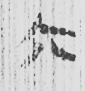六
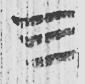三
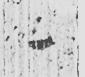一
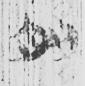刖
